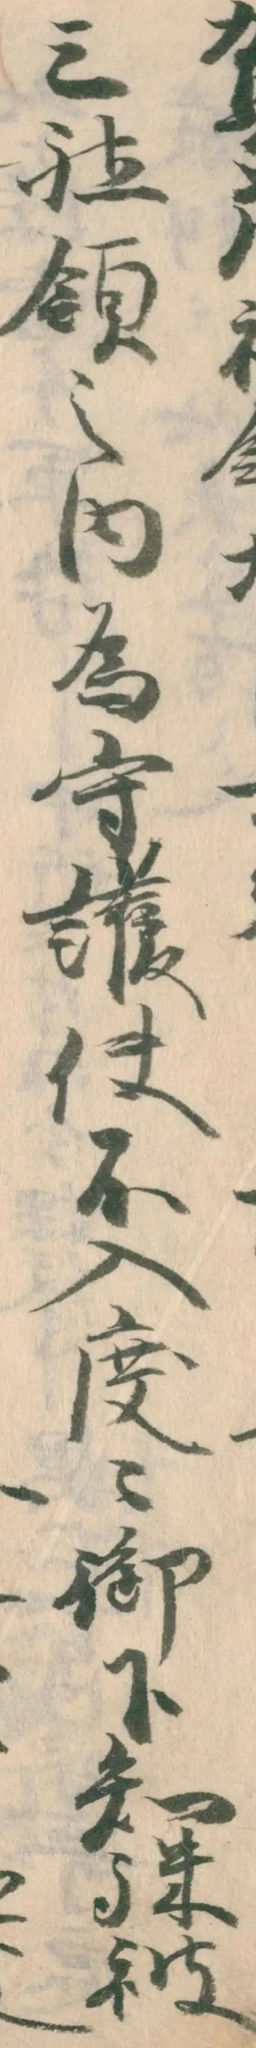三社領之内為守護使不入度々御下知殊被
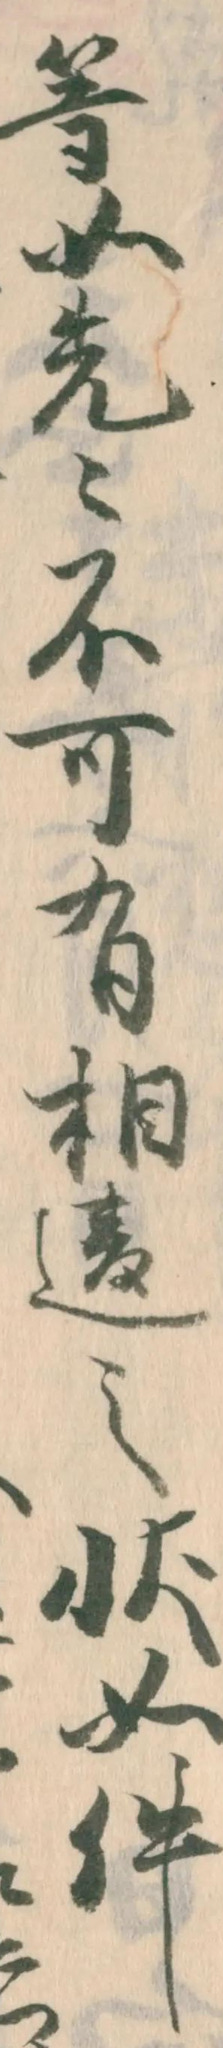等如先々不可有相違之状如件
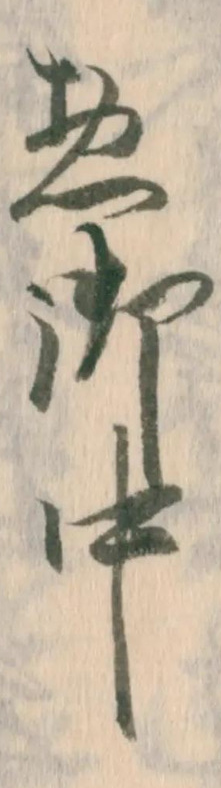惣御中
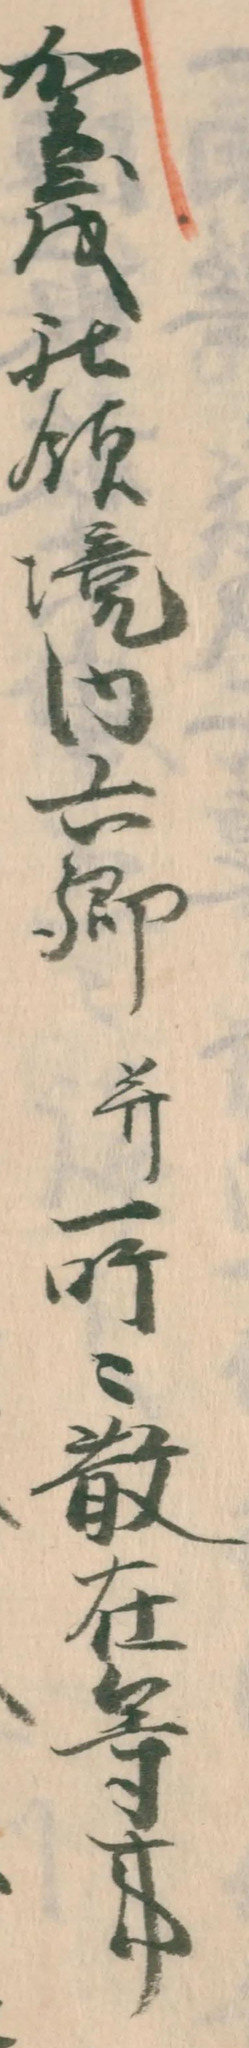賀茂社領境内六郷并所々散在等事
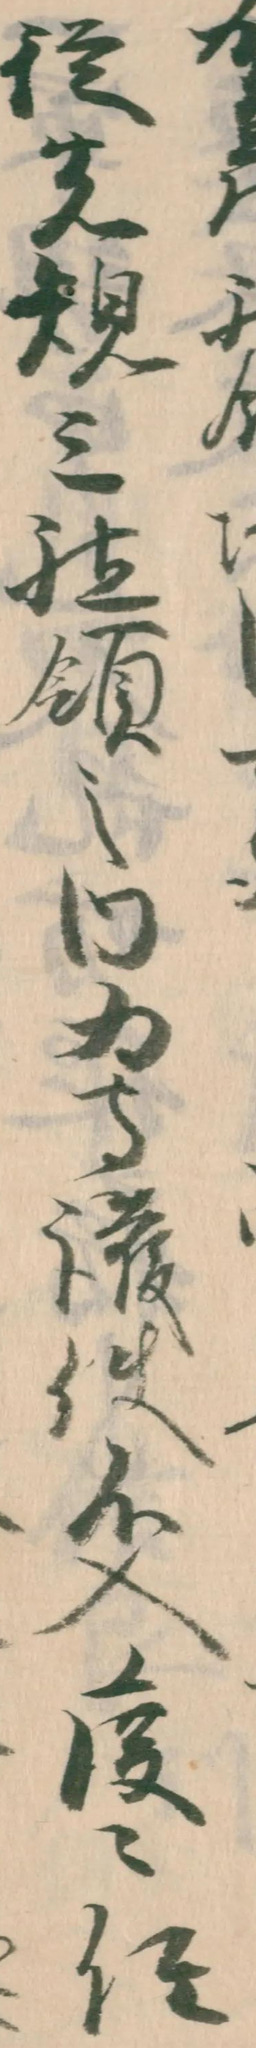従先規三社領之内為守護使不入度々任
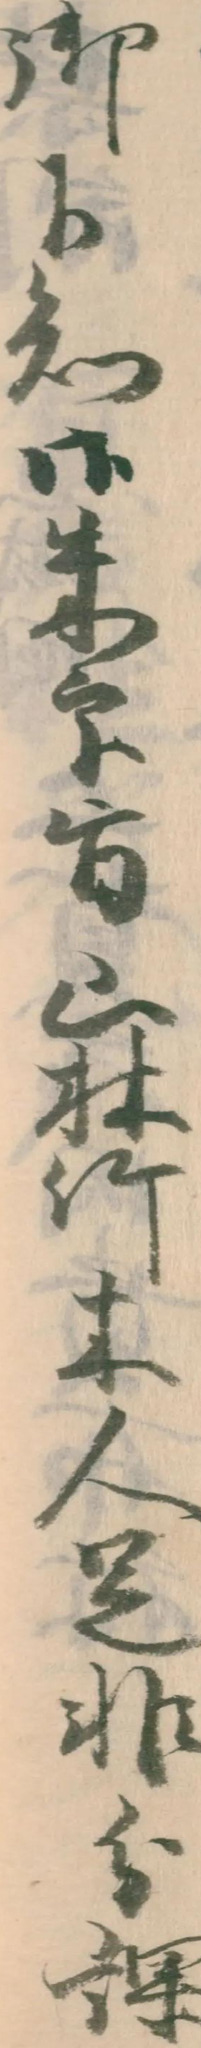御下知御朱印旨山林竹木人足非分課
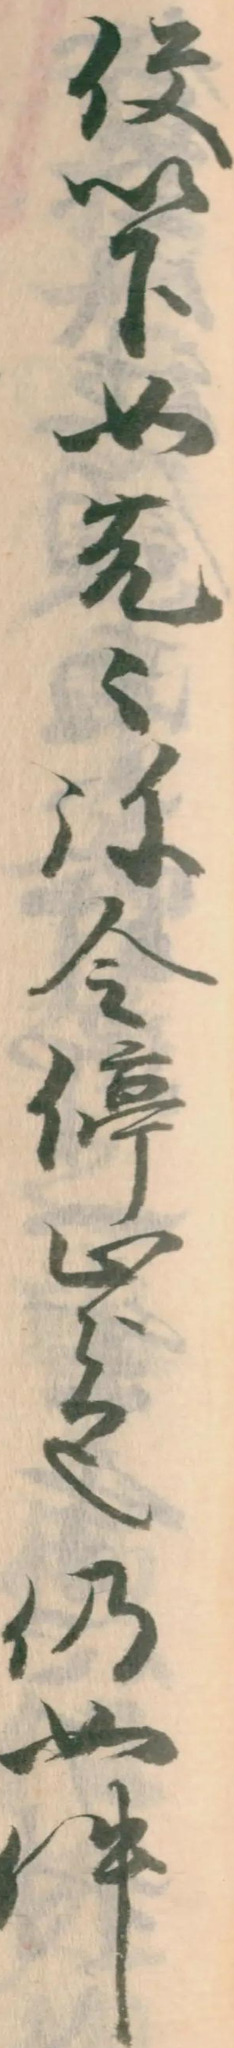役以下如先々弥令停止者也仍如件
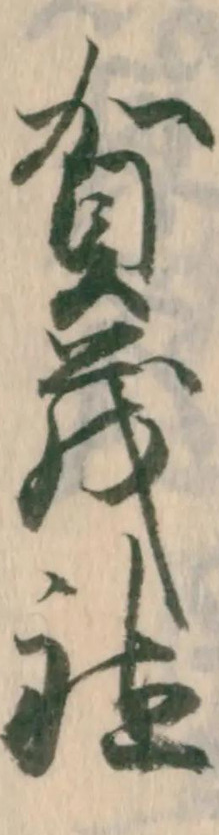賀茂社
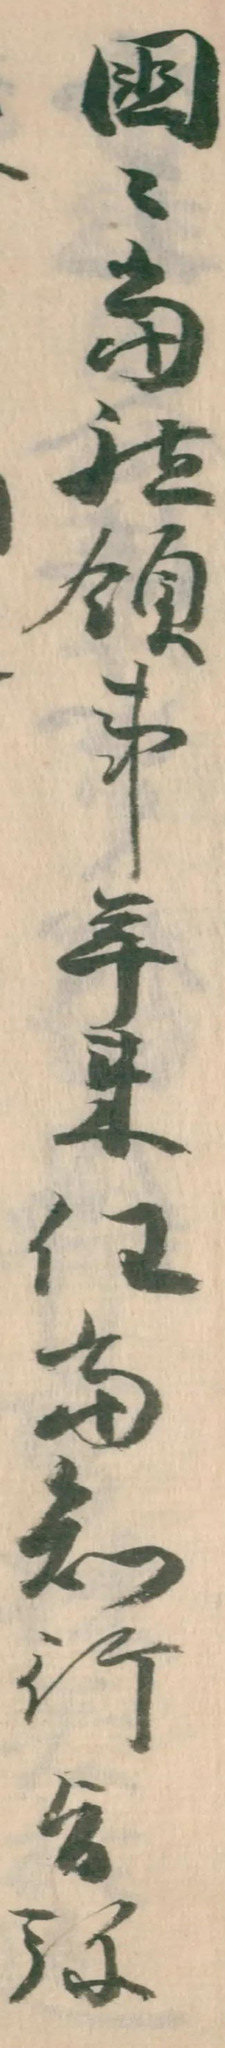国々当社領事年来任当知行旨弥
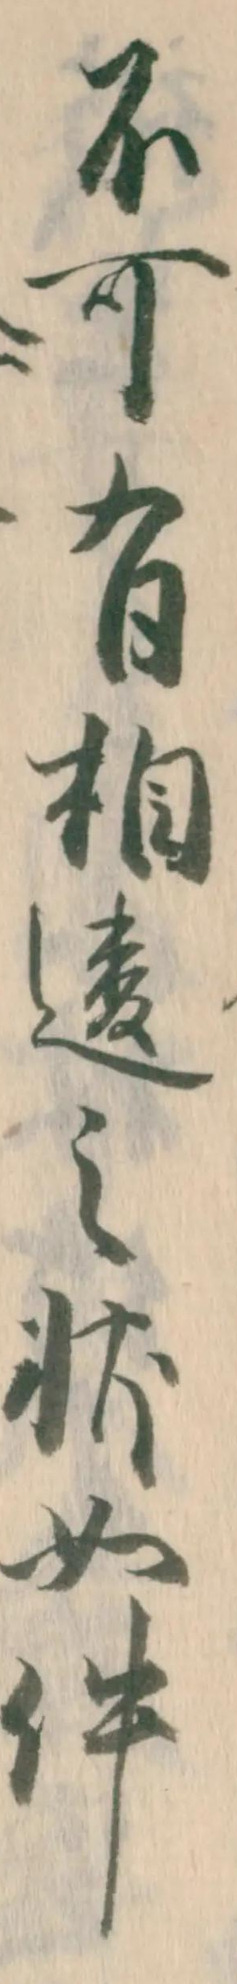不可有相違之状如件
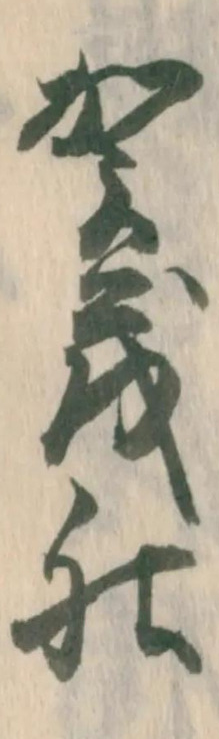賀茂社

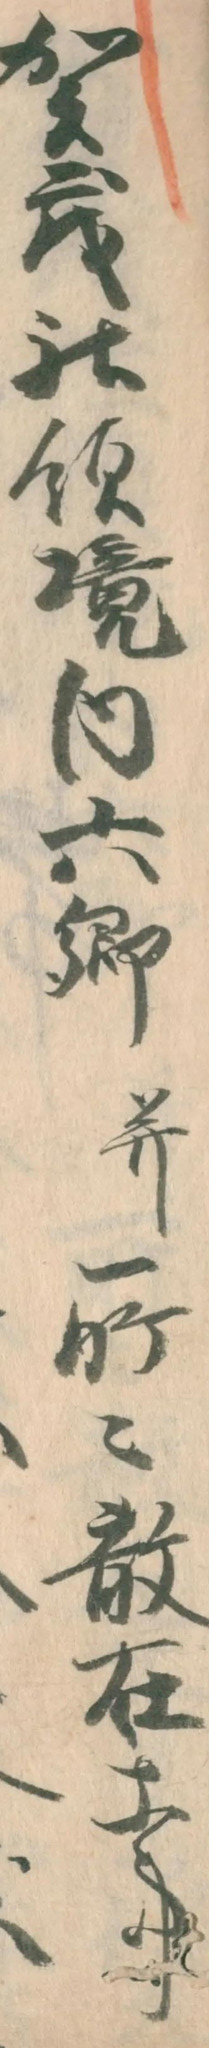賀茂社領境内六郷并所々散在等事
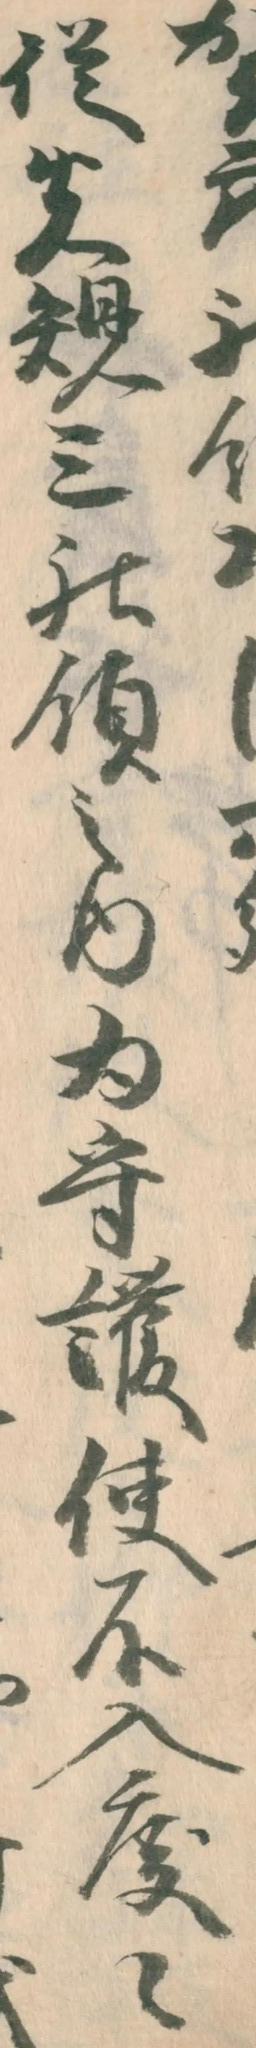従先規三社領之内為守護使不入度々
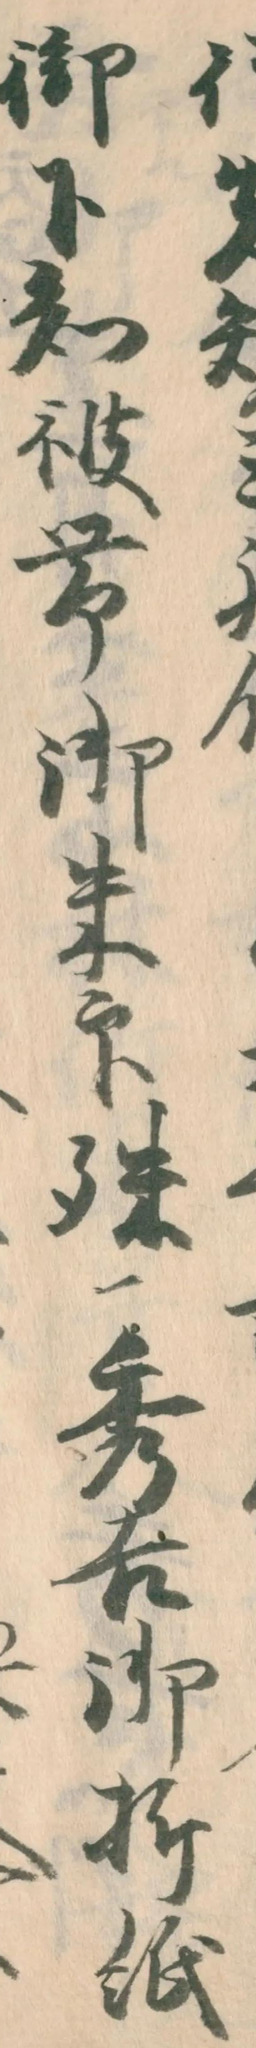御下知被帯御朱印殊秀吉御折紙
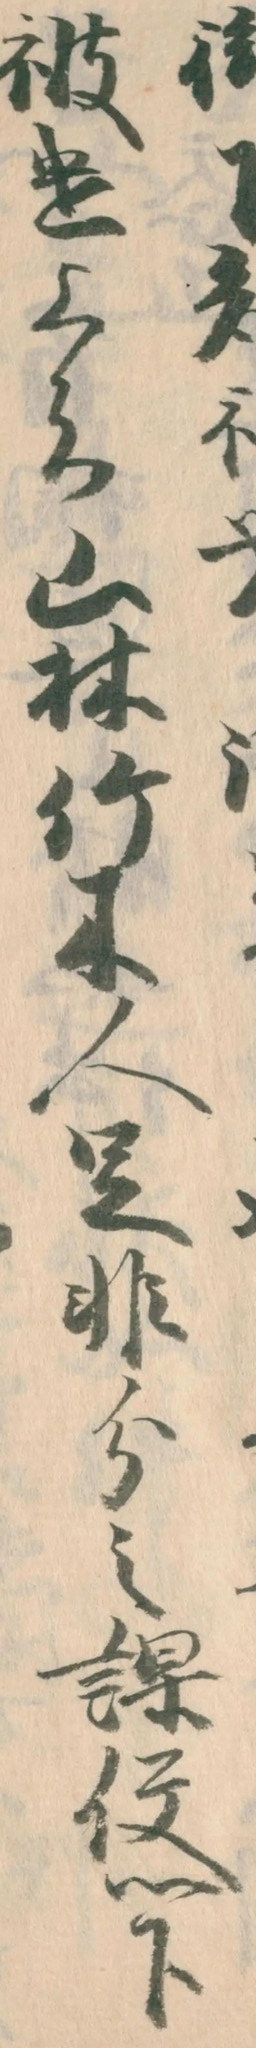被遣上旨山林竹木人足非分之課役以下
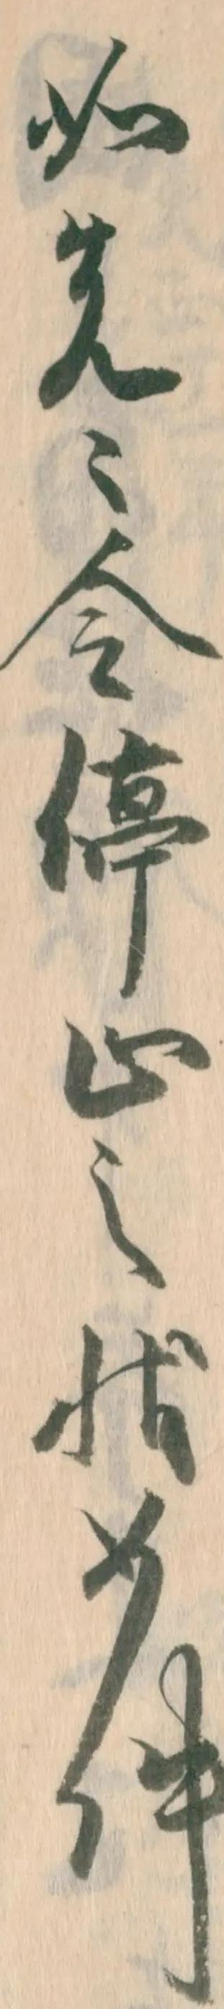如先々令停止之状如件
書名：賀茂社記録. 第1冊
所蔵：国立国会図書館 National Diet Library, JAPAN
